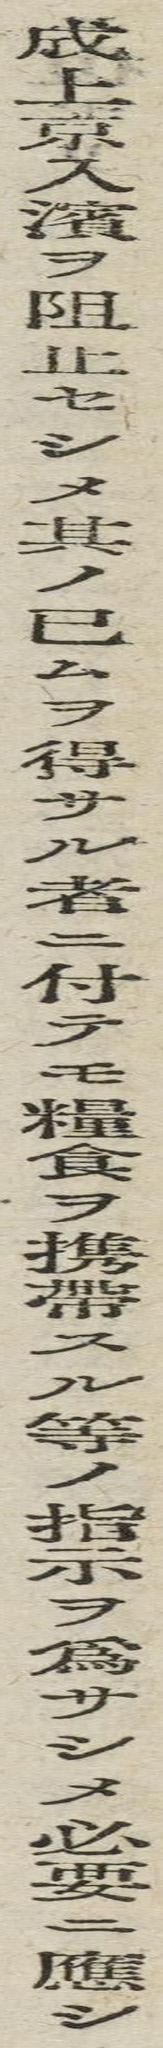成上京入浜ヲ阻止セシメ其ノ已ムヲ得サル者ニ付テモ糧食ヲ携帯スル等ノ指示ヲ為サシメ必要ニ応シ
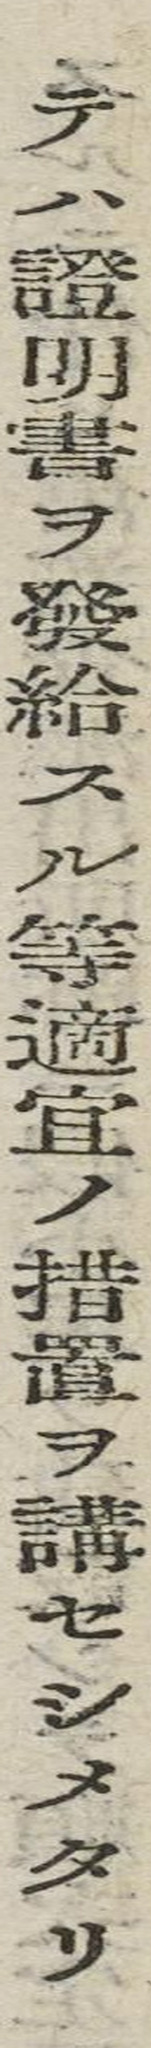テハ證明書ヲ発給スル等適宜ノ措置ヲ講セシメタリ
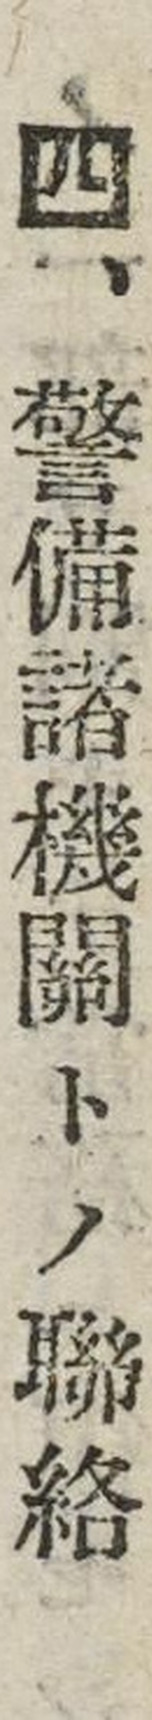四、警備諸機関トノ連絡
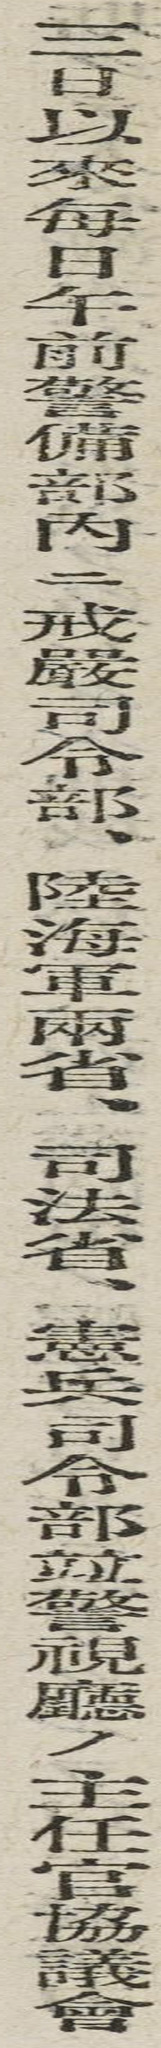三日以来毎日午前警備部内ニ戒厳司令部、陸海軍両省、司法省、憲兵司令部並警視庁ノ主任官協議会
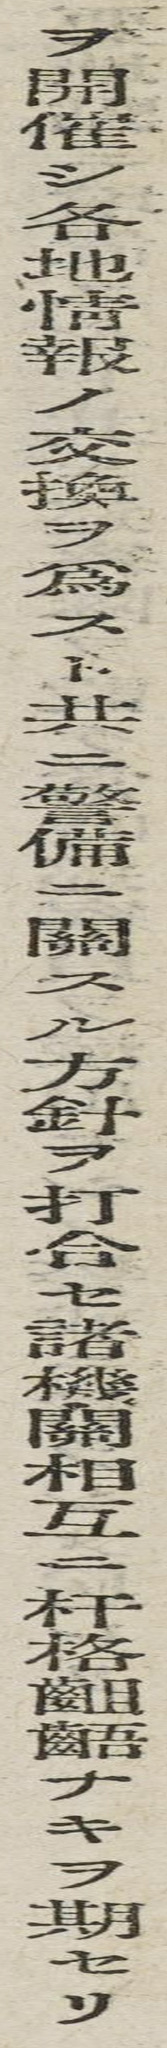ヲ開催シ各地情報ノ交換ヲ為スト共ニ警備ニ関スル方針ヲ打合セ諸機関相互ニ杅格齟齬ナキヲ期セリ
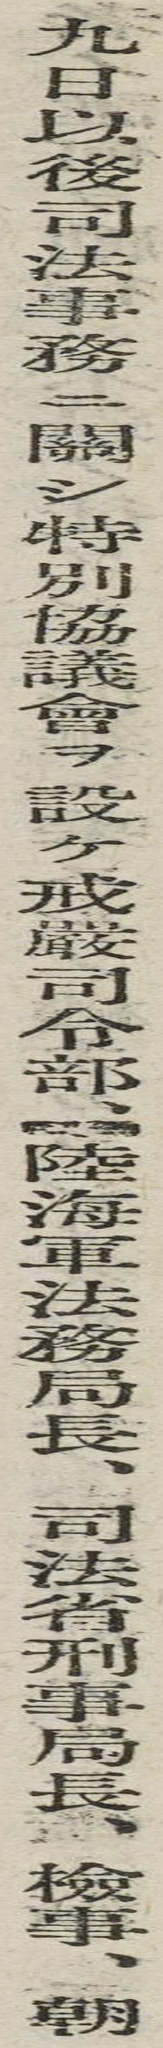九日以後司法事務ニ関シ特別協議会ヲ設ケ戒厳司令部、陸海軍法務局長、司法省刑事局長、検事、朝
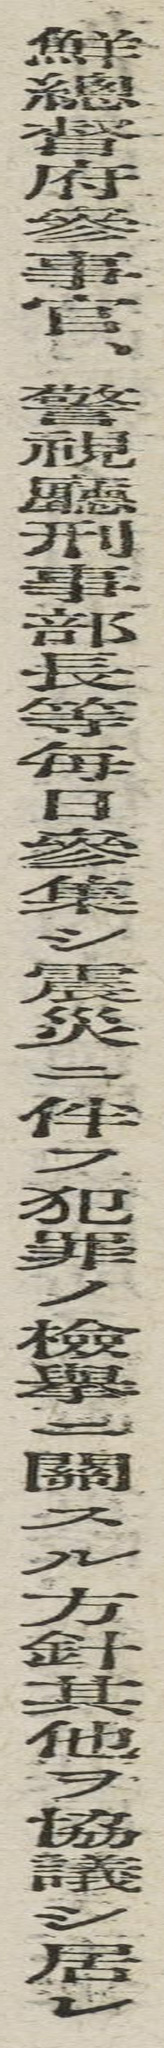鮮総督府参事官、警視庁刑事部長等毎日参集シ震災ニ伴フ犯罪ノ検挙ニ関スル方針其他ヲ協議シ居レ
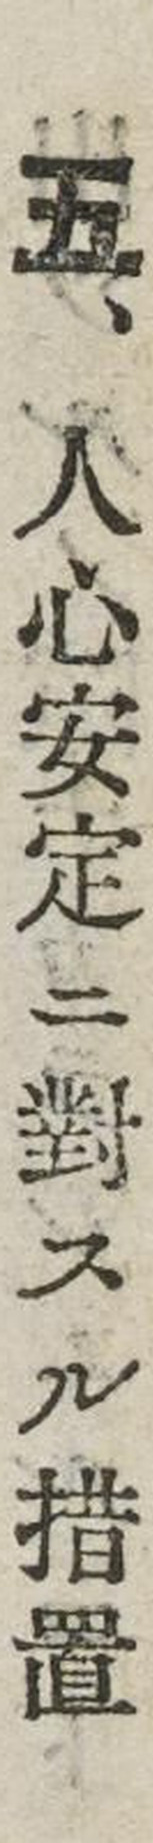五、人心安定ニ対スル措置
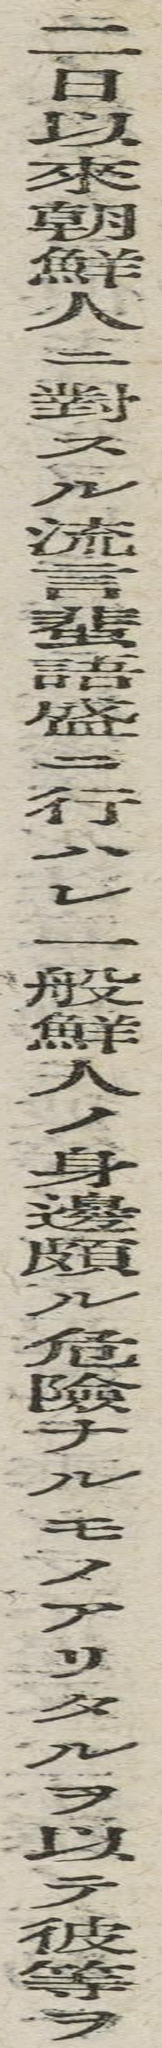二日以来朝鮮人ニ対スル流言飛語盛ニ行ハレ一般鮮人ノ身辺頗ル危険ナルモノアリタルヲ以テ彼等ヲ
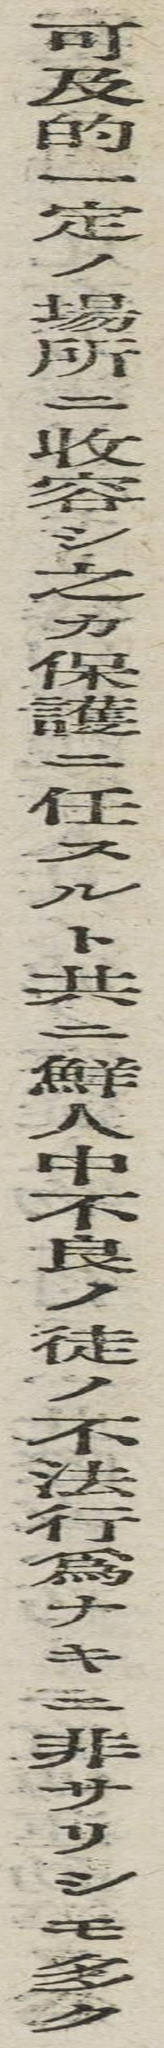可及的一定ノ場所ニ収容シ之カ保護ニ任スルト共ニ鮮人中不良ノ徒ノ不法行為ナキニ非サリシモ多ク
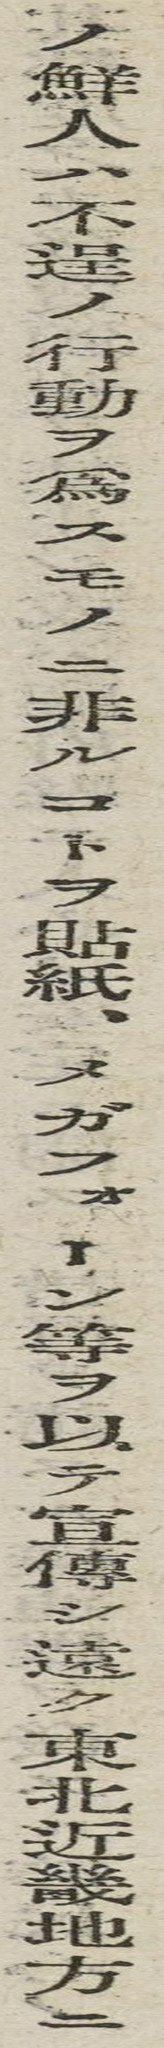ノ鮮人ハ不逞ノ行動ヲ為スモノニ非ルコトヲ貼紙、メガフォーン等ヲ以テ宣伝シ遠ク東北近畿地方ニ
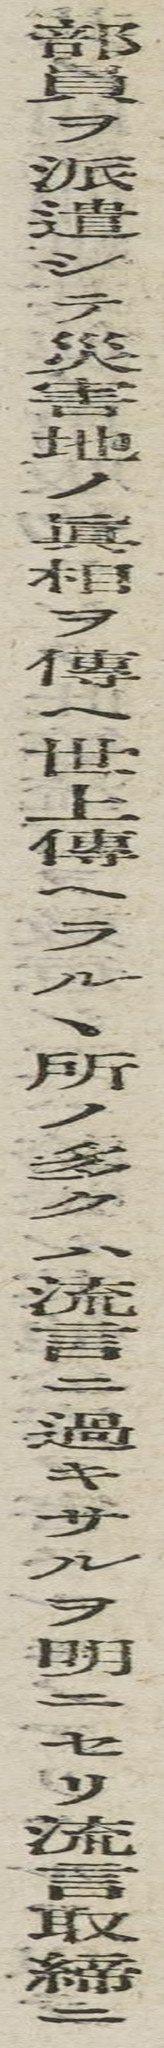部員ヲ派遣シテ災害地ノ実相ヲ伝ヘ世上伝ヘラルヽ所ノ多クハ流言ニ過キサルヲ明ニセリ流言取締ニ
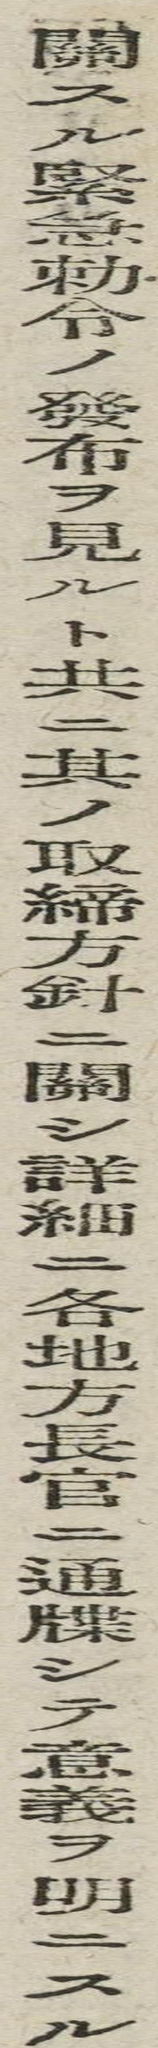関スル緊急勅令ノ発布ヲ見ルト共ニ其ノ取締方針ニ関シ詳細ニ各地方長官ニ通牒シテ意義ヲ明ニスル

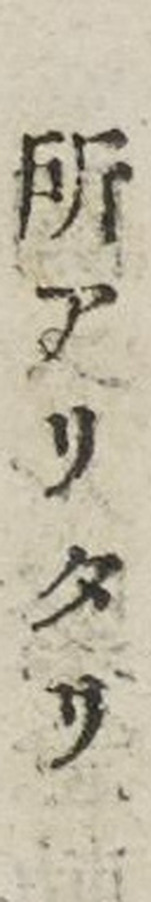所アリタリ
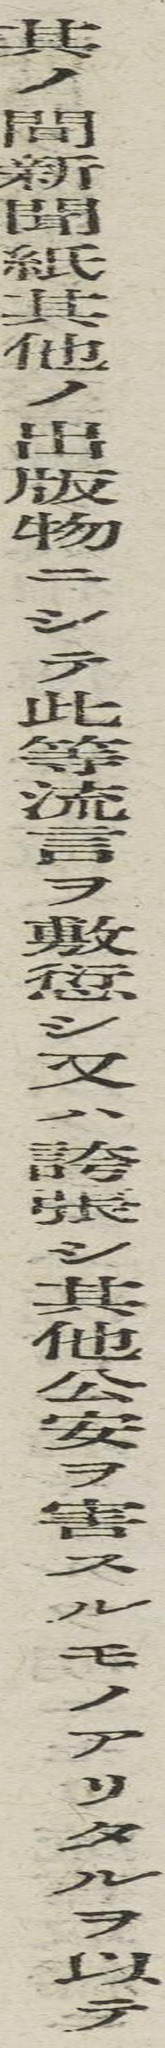其ノ間新聞紙其他ノ出版物ニシテ此等流言ヲ敷愆シ又ハ誇張シ其他弘安ヲ害スルモノアリタルヲ以テ
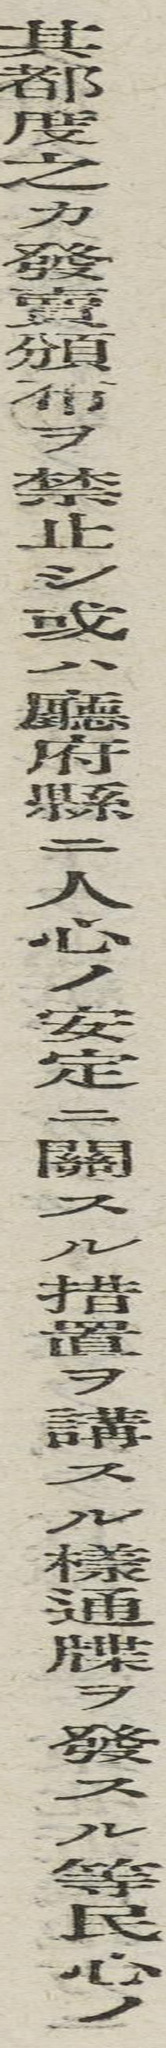其都度之カ発売頒布ヲ禁止シ或ハ庁府県ニ人心ノ安定ニ関スル措置ヲ講スル様通牒ヲ発スル等民心ノ
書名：震災被害状況並救護施設概要
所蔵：東京大学地震研究所図書室 Earthquake Research Institute Library, The University of Tokyo, JAPAN
